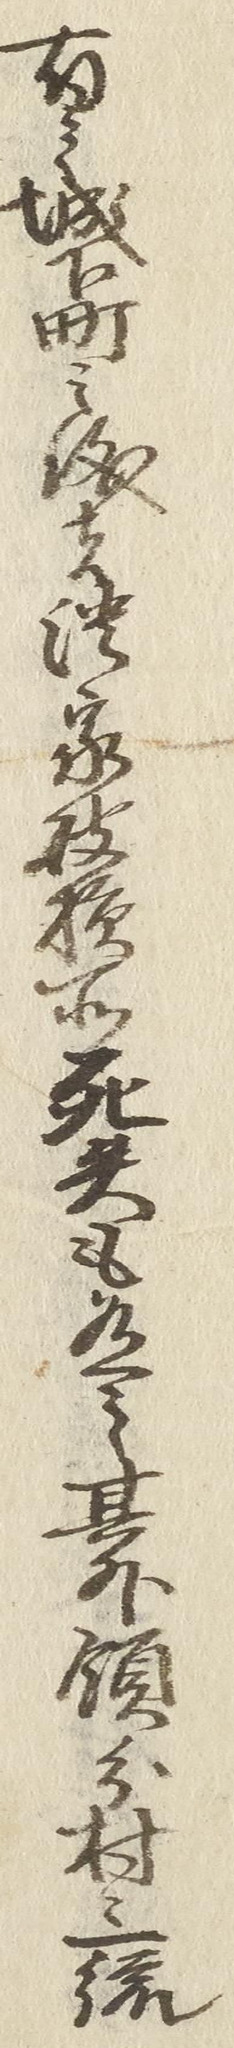有之城下町之儀は潰家破損所死失も有之其外領分村々一統
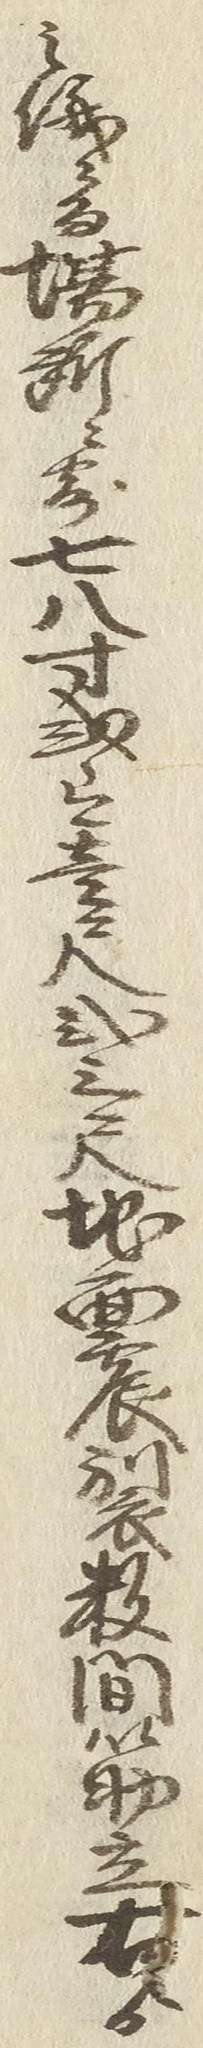之儀二而場所二寄七八寸或は壱尺弐三尺地面震裂数間筋立村ゟ
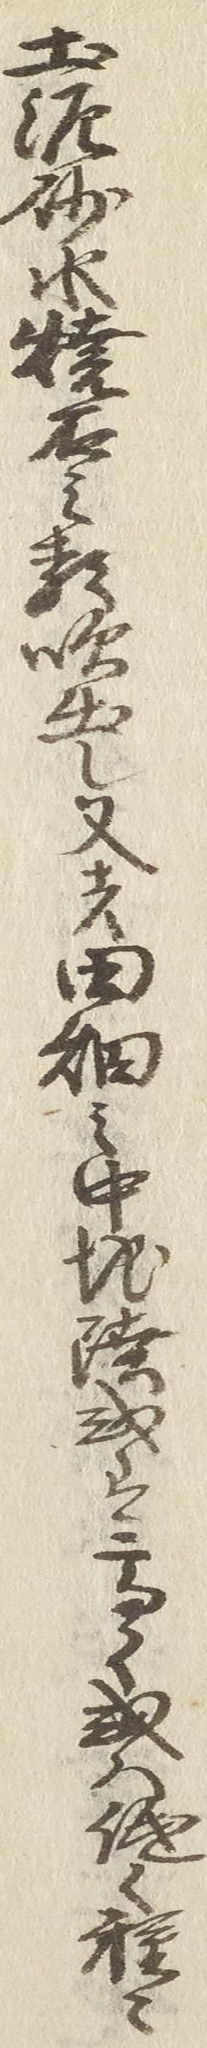土泥砂水焼石之類吹出し又は田畑之中地続或は高く或は低く種々
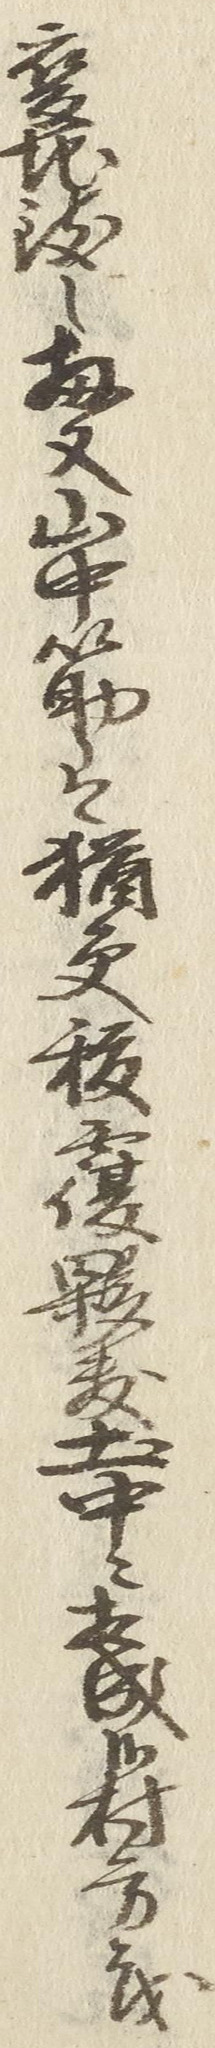変地致し扨又山中筋は猶更抜覆夥敷土中二相成候村方も
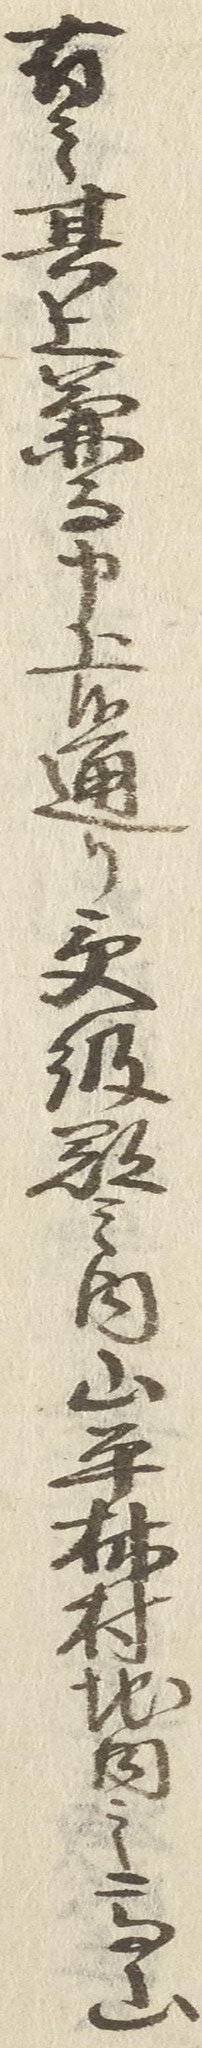有之其上兼而申上候通り更級郡之内山平林村地内之高山
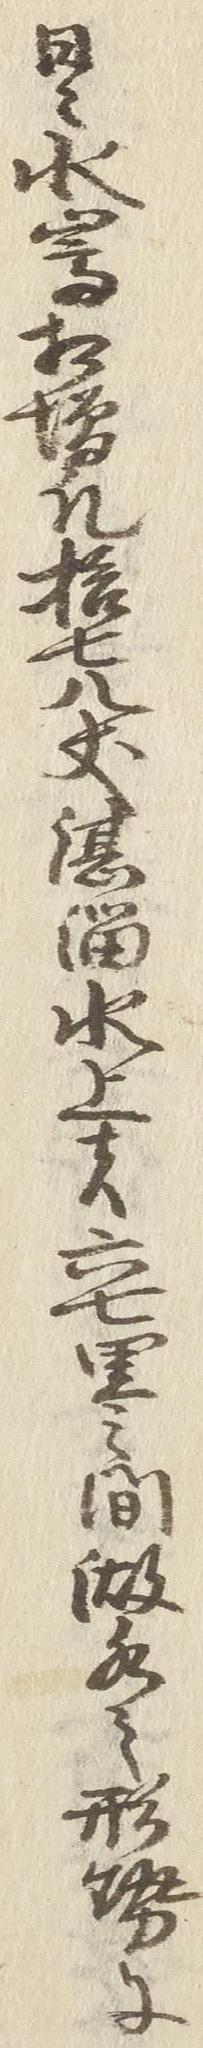日々水嵩相増凡拾七八丈湛溜水上は六七里之間湖水之形勢に
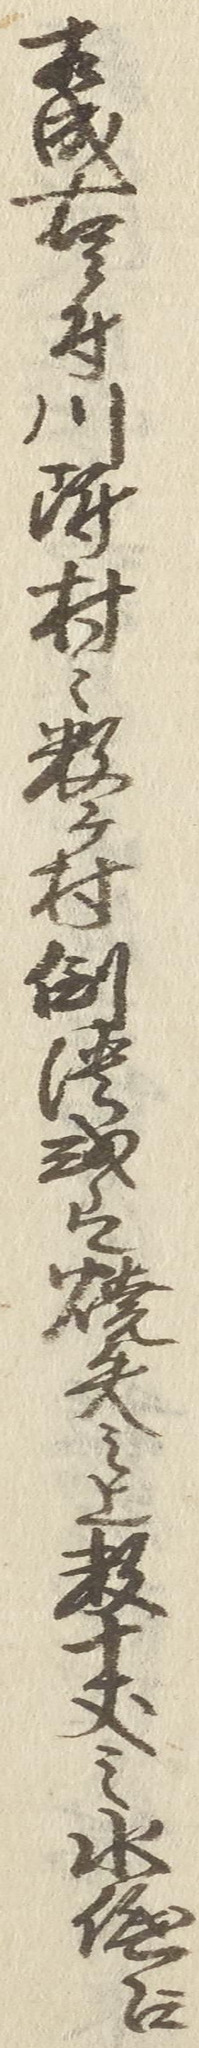相成右二付川附村々之数ヶ村倒潰或は焼失之上数十丈之水底江

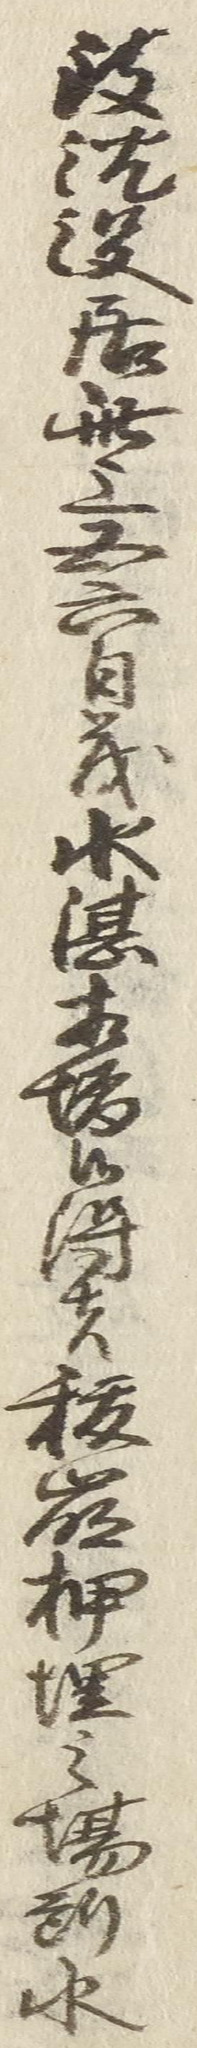致沈没居此上五六月も水湛相増候得は抜崩押埋之場所水
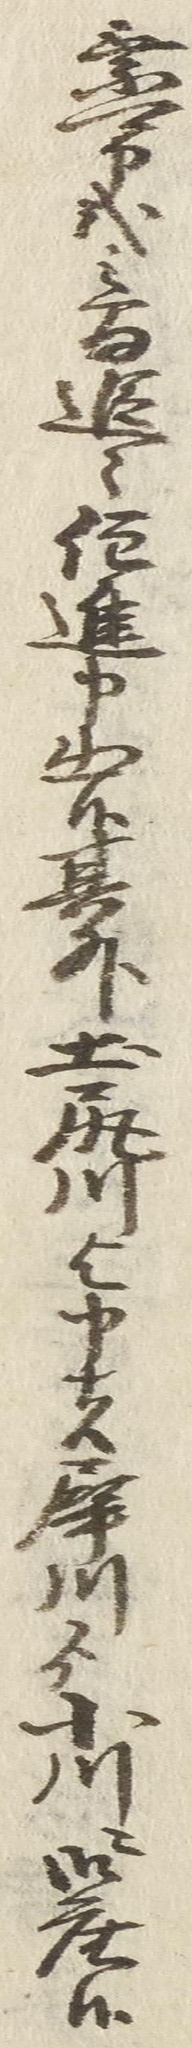乗可申哉之由追々注進申出候其外土尻川と申は犀川ゟ小川二御座候
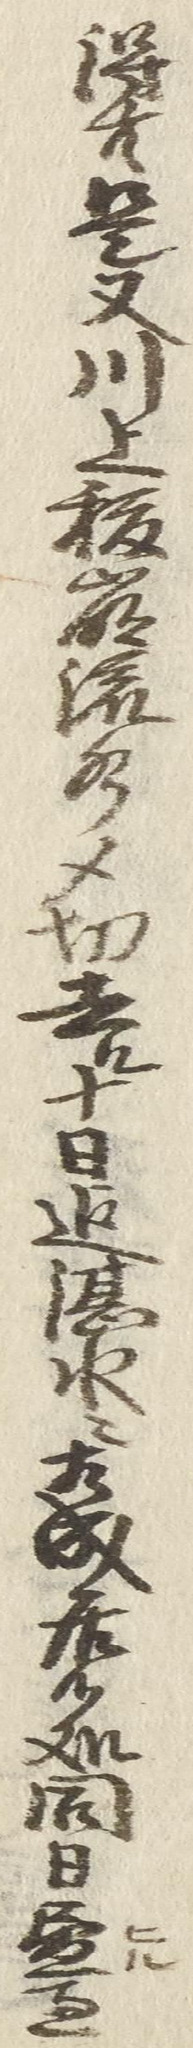得共是又川上抜崩流水〆切去ㇽ十日迄湛水二相成居候処同日昼過
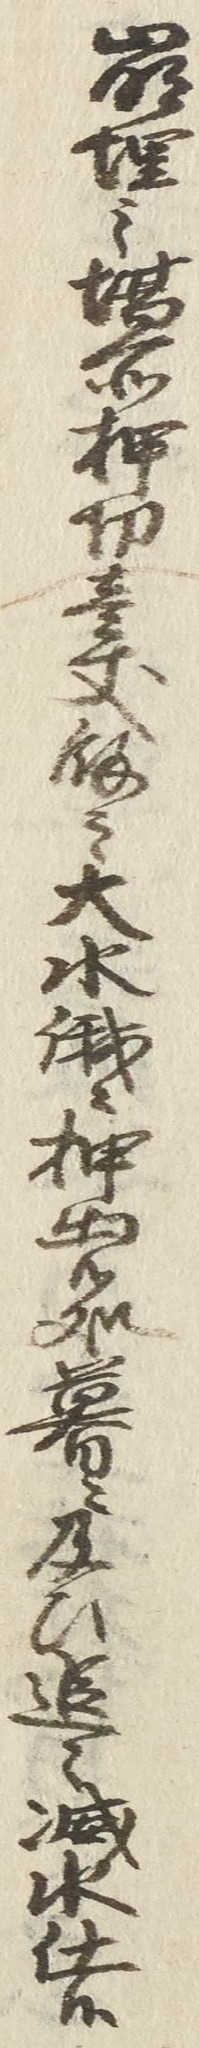崩埋之場所押切壱丈餘之大水俄二押出候処暮二及び追々減水仕候
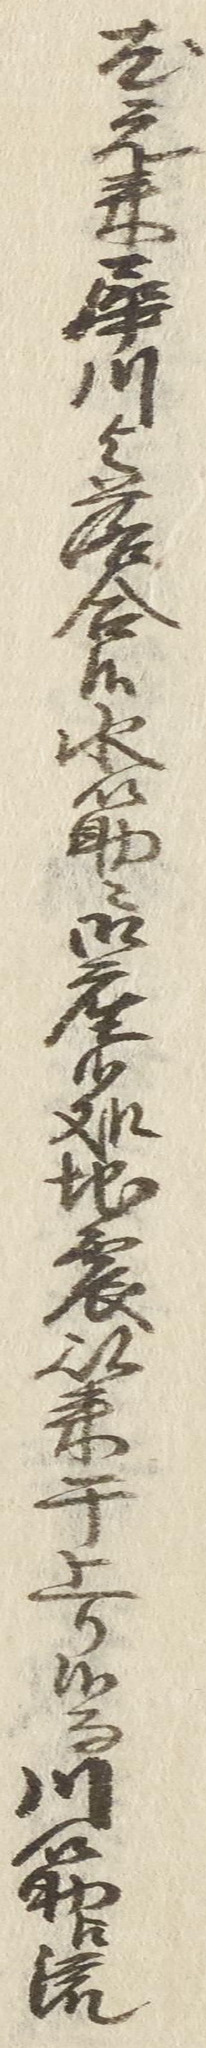尤元来犀川と落合候水筋二御座候処地震以来干上り候而川筋得流
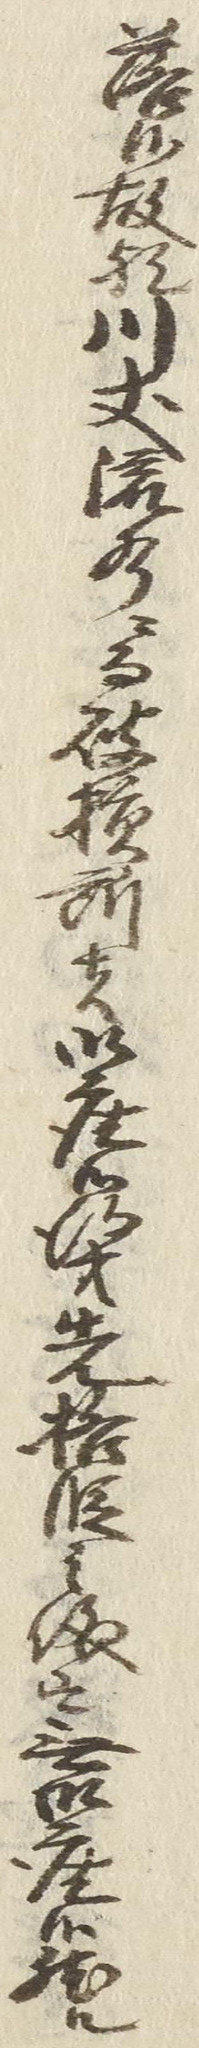落候故川丈流水二而破損所は御座候得共先格段之儀は無御座候然ㇽ
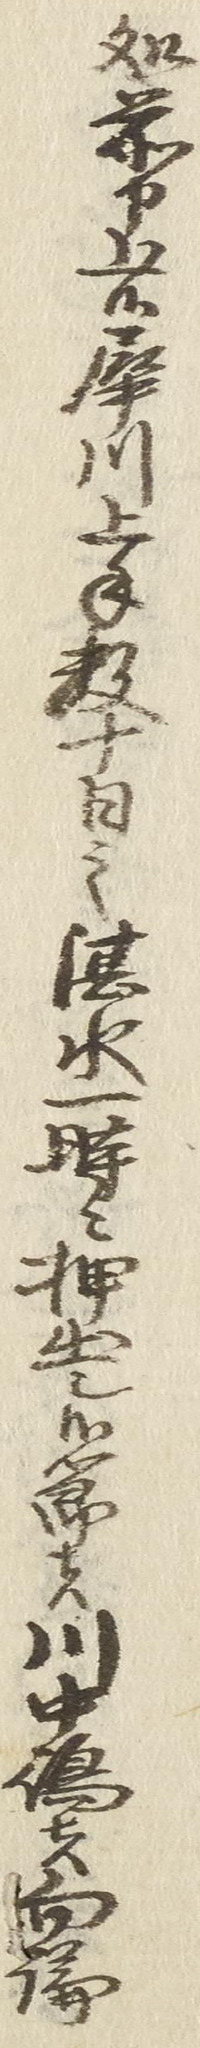処前申上候犀川上手数十日之湛水一時二押出し候節は川中嶋は勿論
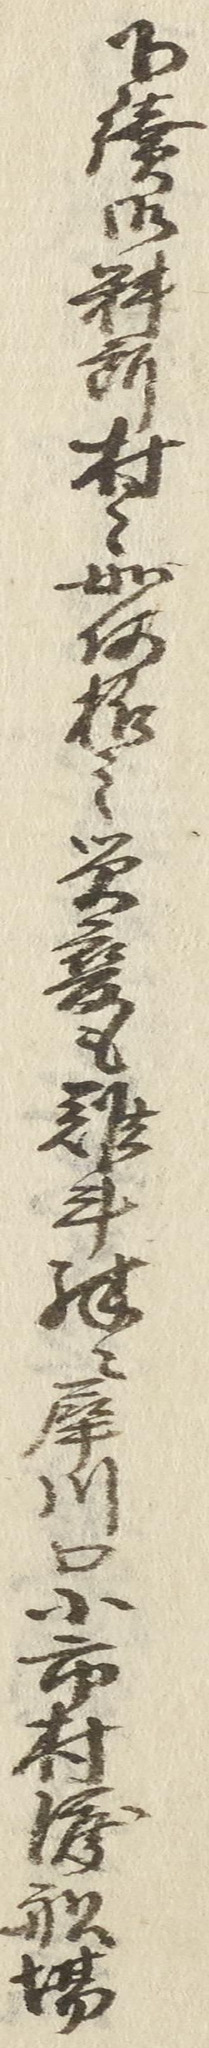下続御料所村々如何様之災変も難斗殊二犀川口小市村渡船場
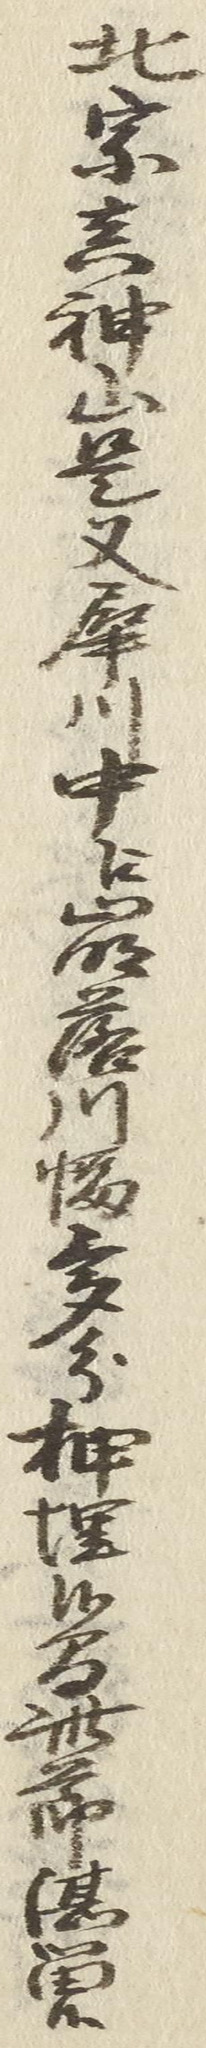北字真神山是又犀川江崩落川幅多分押埋候間此節湛留候
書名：従往古地震御届書記誌之一
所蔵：東京大学地震研究所図書室 Earthquake Research Institute Library, The University of Tokyo, JAPAN
